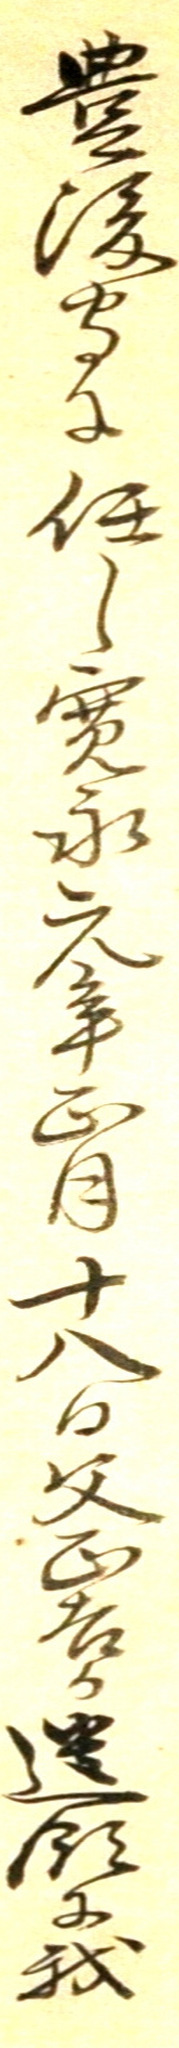豊後守に任し寛永元年正月十八日父正吉か遺領に我
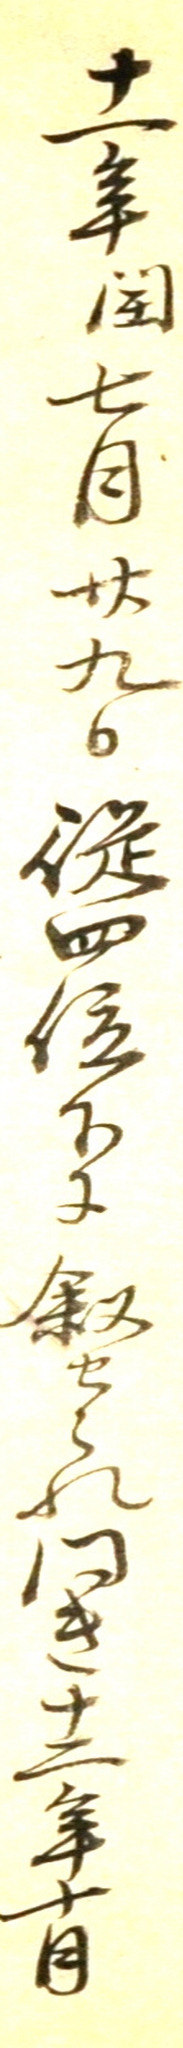十一年閏七月廿九日従四位下に叙せられ同き十二年十月
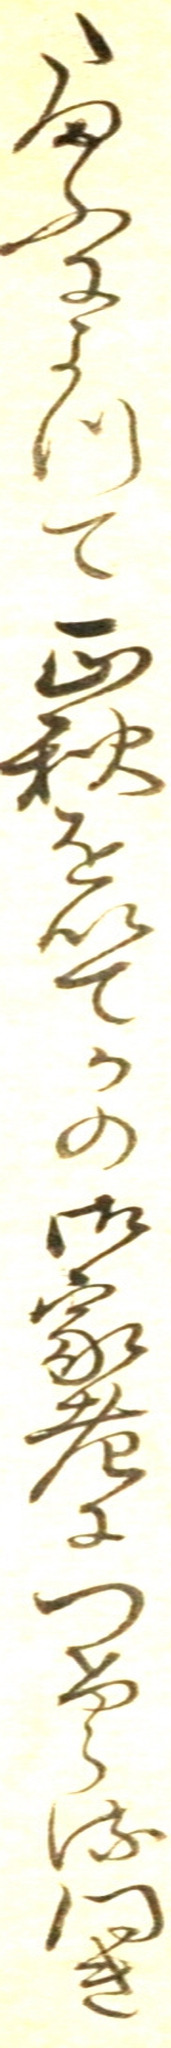たまふによつて正秋を以てかの御家老につけらる同き
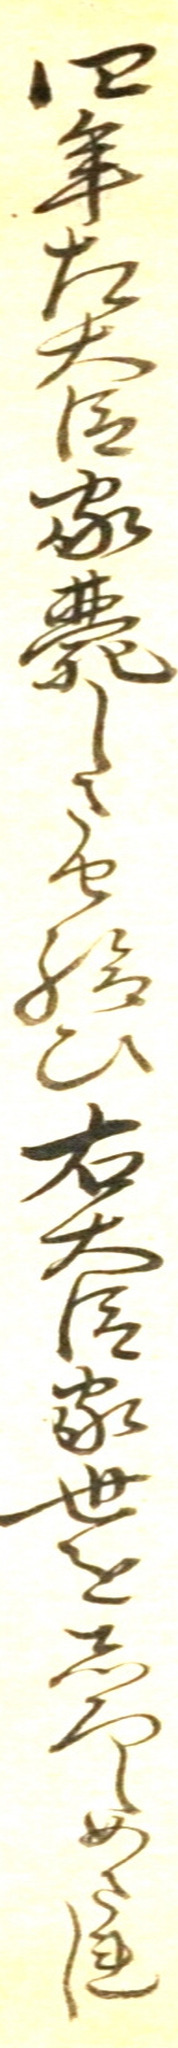四年左大臣家薨しさせ給ひ右大臣家世をしろしめされし
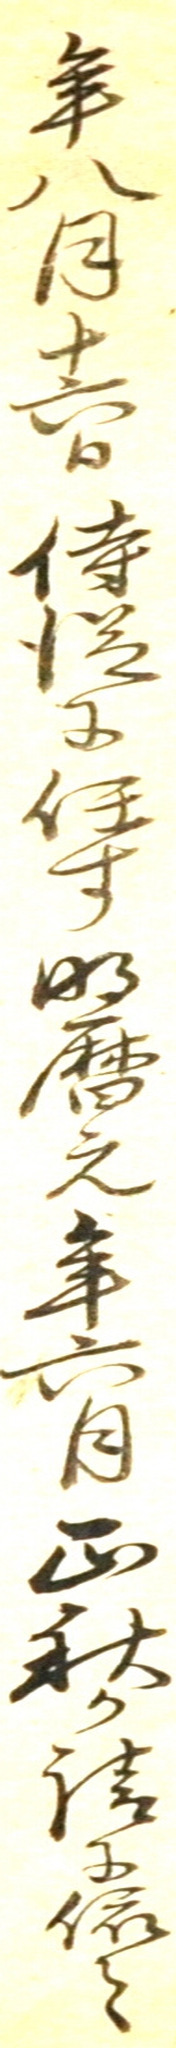年八月十六日侍従に任す明暦元年六月正秋か請に依て
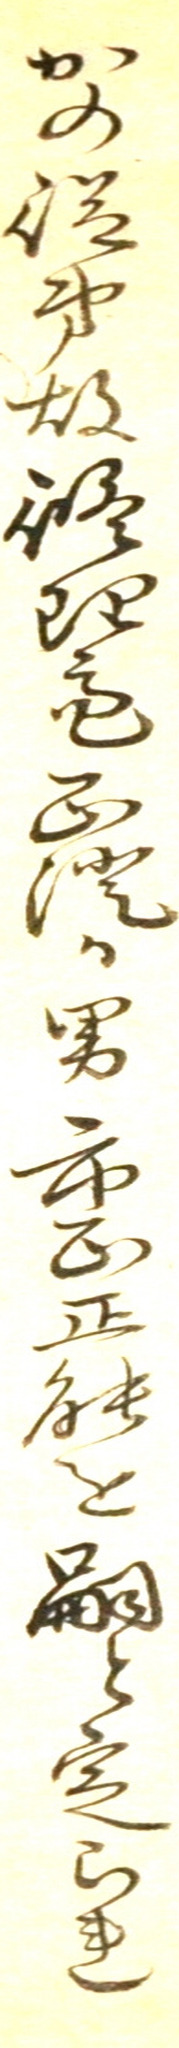かの従弟故修理亮正澄か男市正正能を嗣と定られ
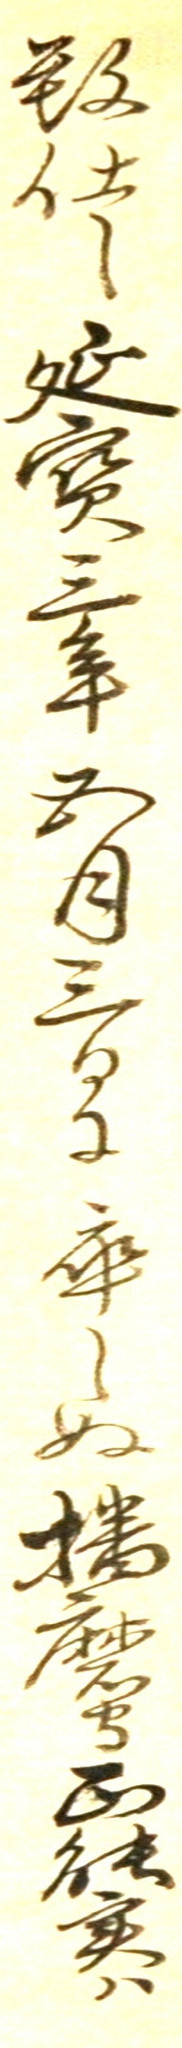致仕し延宝三年五月三日に卒しぬ播磨守正能実は

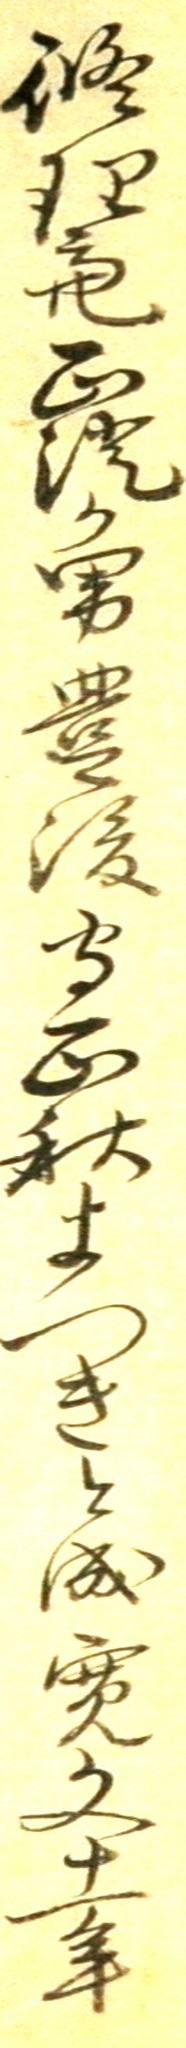修理亮正澄か男豊後守正秋よつきと成寛文十一年
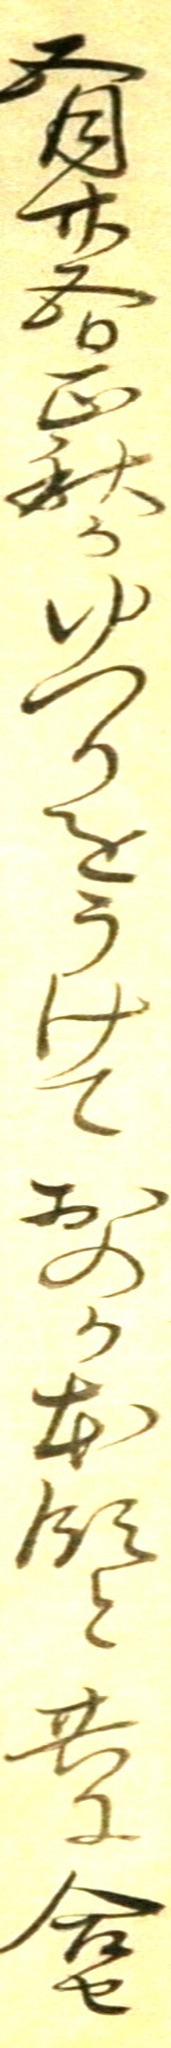五月廿五日正秋かゆつりをうけておのか本領と共に合せ
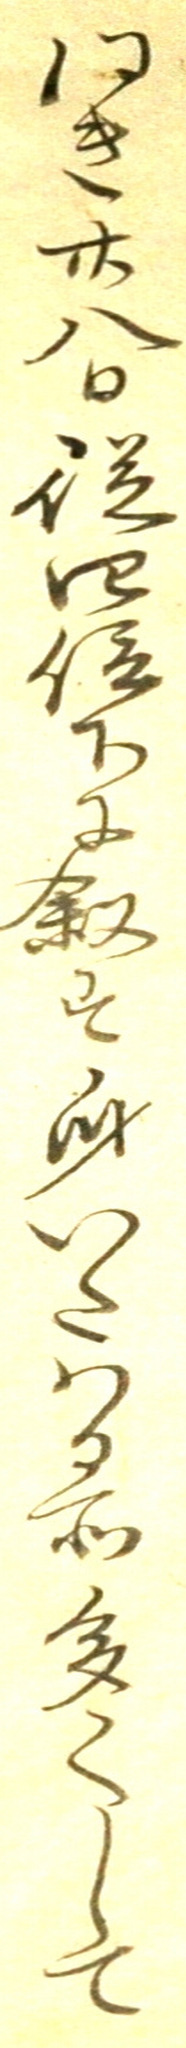同き廿八日従四位下に叙す身いたわる所多くして
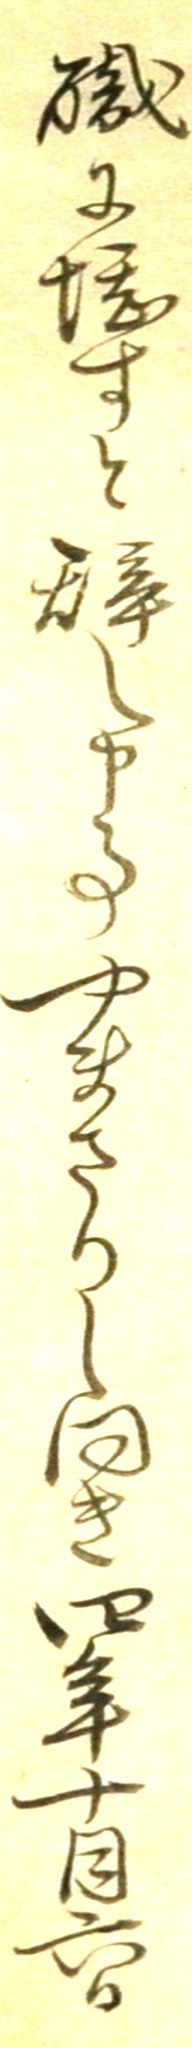職に堪すと辞し申事やまさりし同き四年十月六日
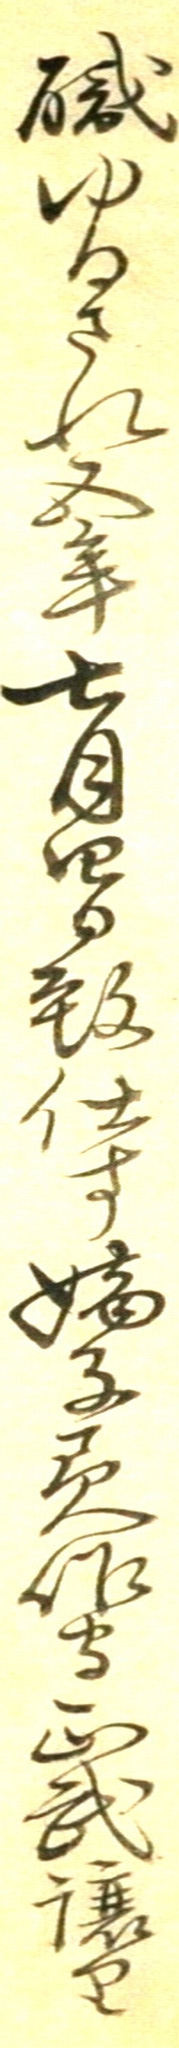職ゆるされ五年七月四日致仕す嫡子美作守正武譲り
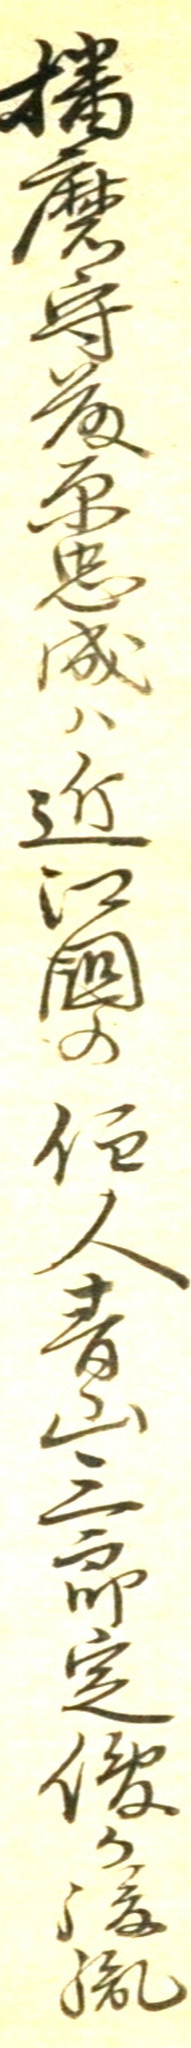播磨守藤原忠成は近江国の住人青山三郎定俊か後胤
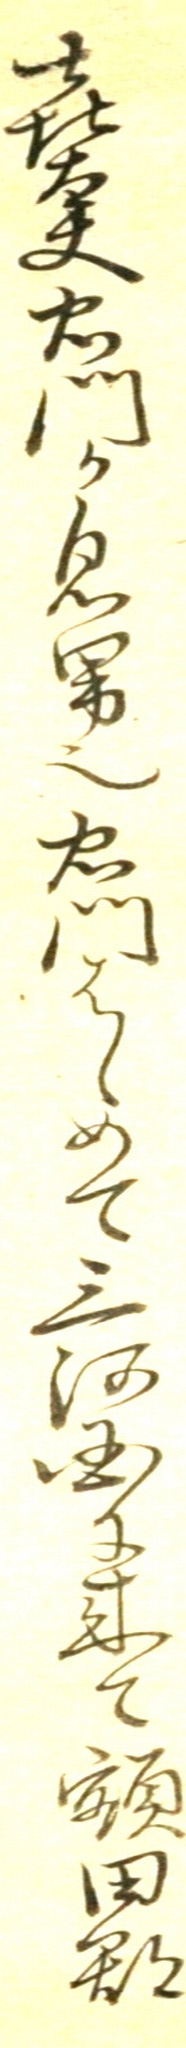喜太夫忠門か息男也忠門はしめて三河国に来て額田郡
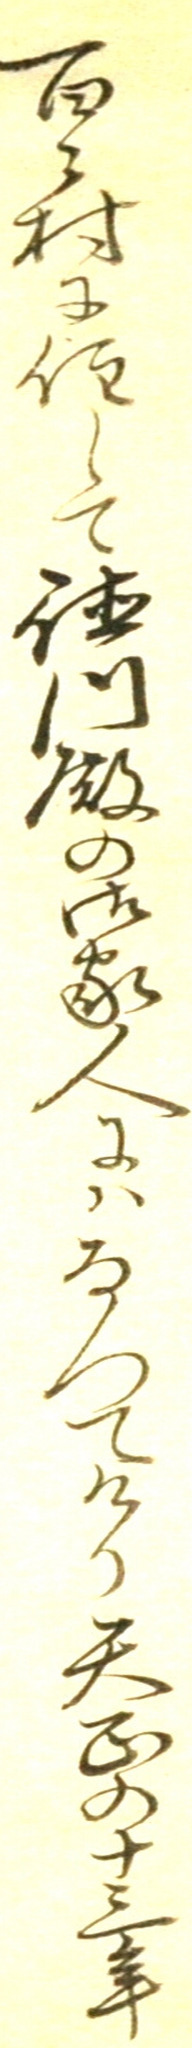百々村に住して徳川殿の御家人にはなつてけり天正の十三年
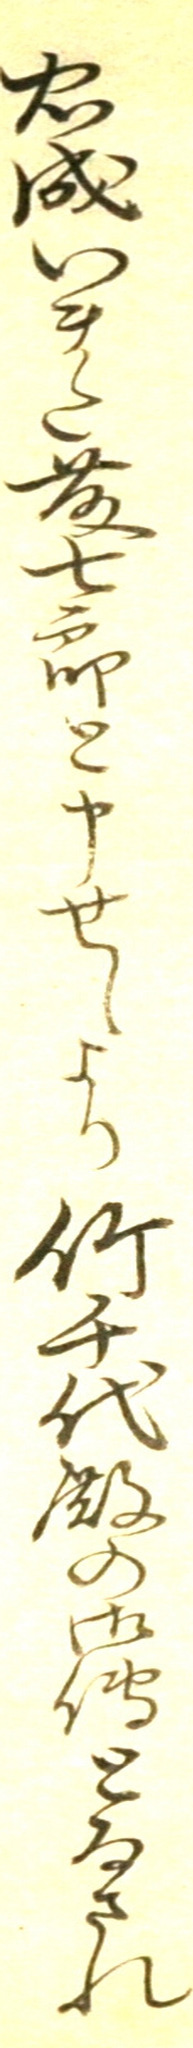忠成いまた藤七郎と申せしより竹千代殿の御傅となされ
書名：藩翰譜（五）
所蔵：伊那市立高遠町図書館・合同会社AMANE
